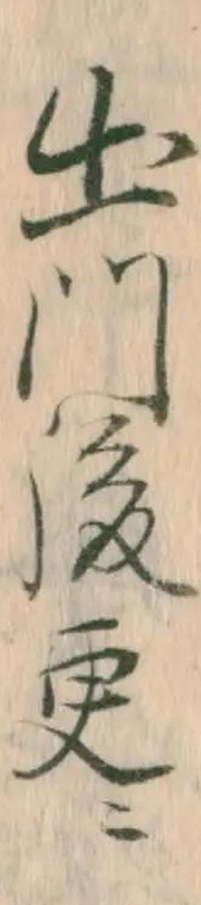出門後更ニ
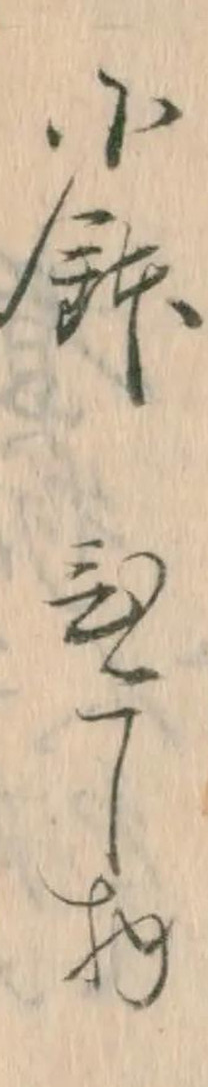小鉢ひたし物
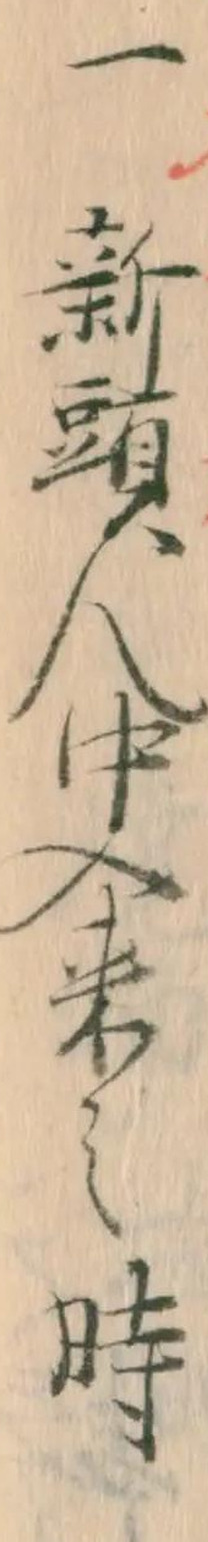一新頭人中入来之時
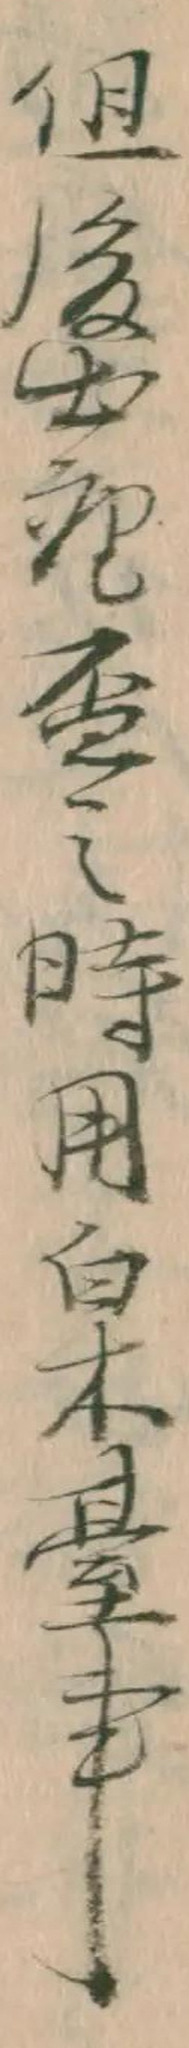但後出座盃之時用白木䑓事
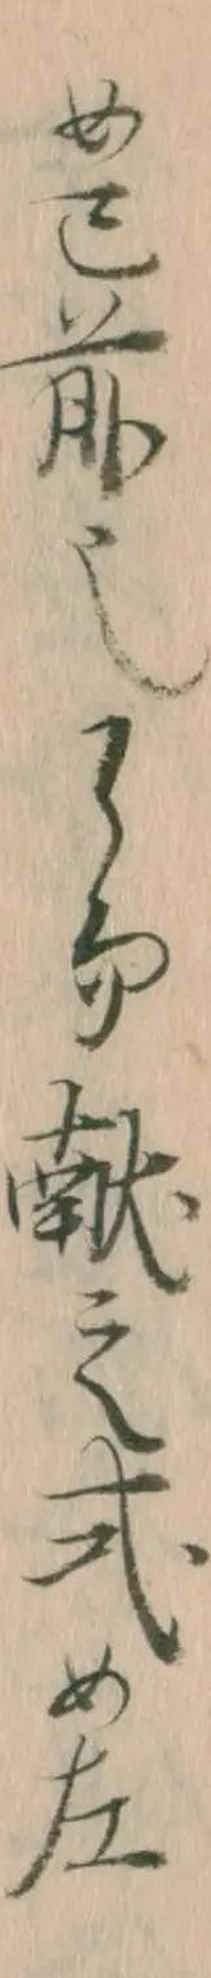如巳前也了而献之式如左
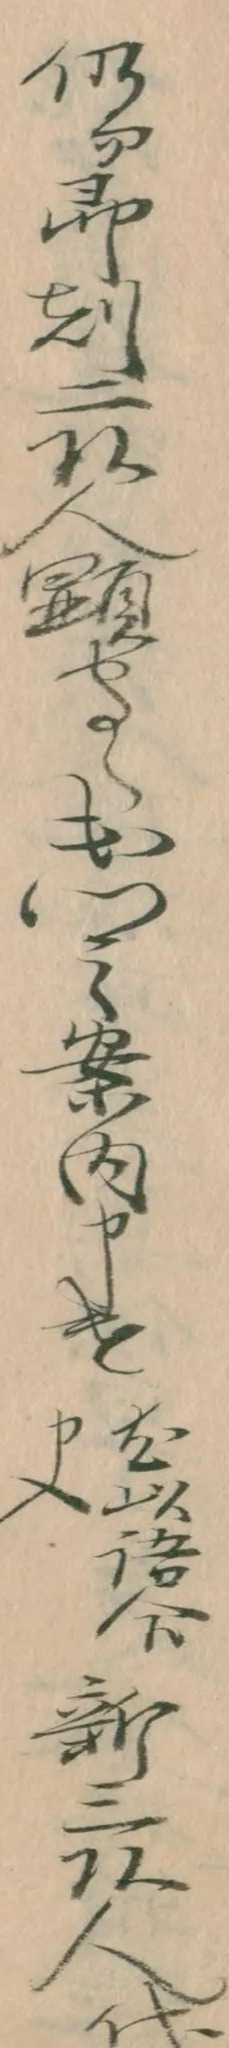仍而即刻二頭人顕守へ出門之案内申遣尤以語合申入新三頭人代

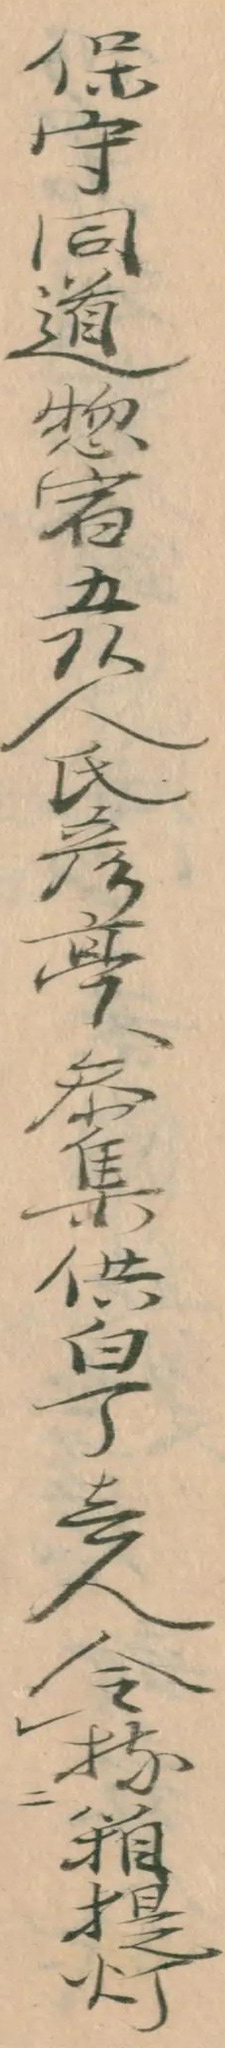保守同道惣宿五頭人氏彦亭へ参集供白丁壱人令持箱提灯
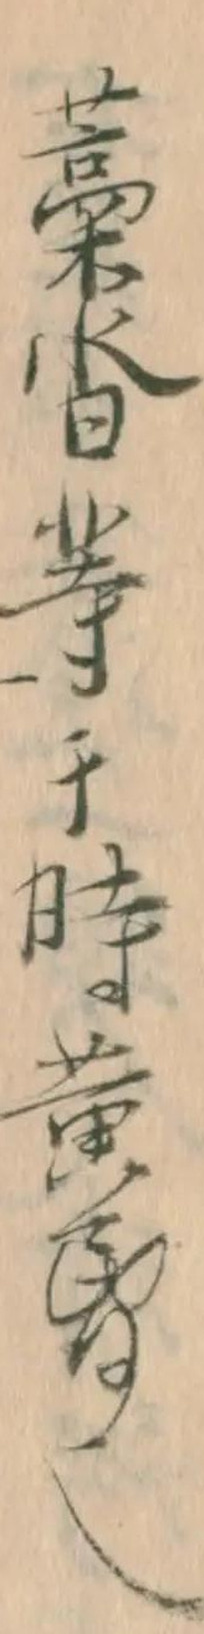藁沓等于時黄昏也
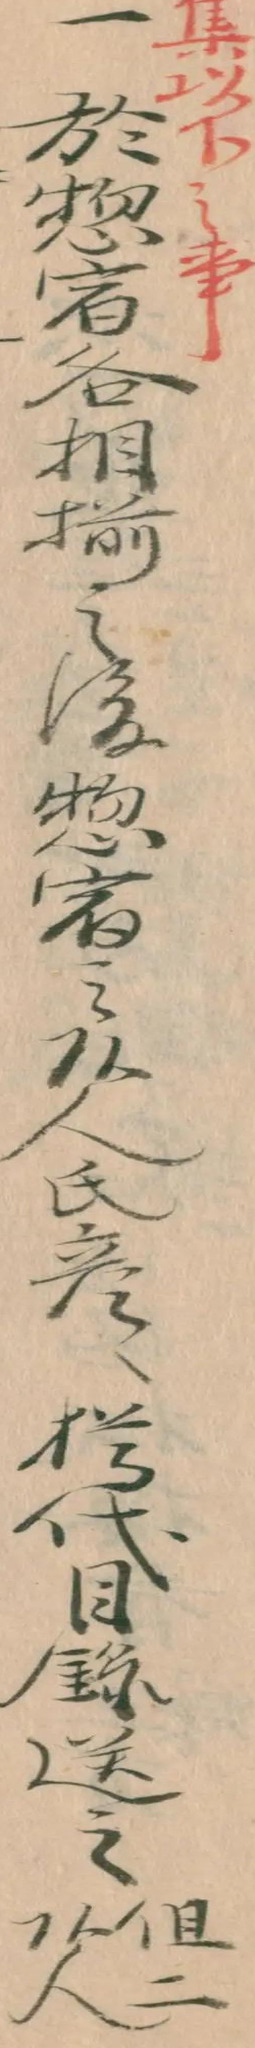一於惣宿各相揃之後惣宿之頭人氏彦へ樽代目録送之但二頭人
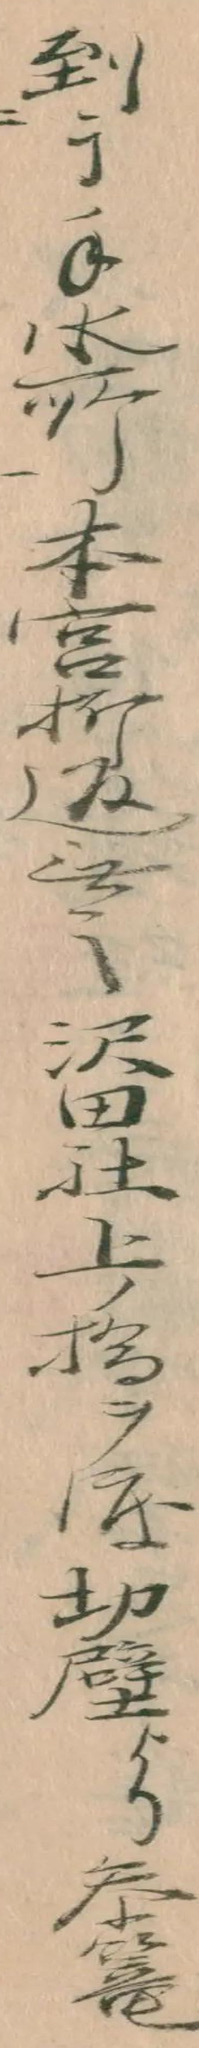到于手水所本宮折返無之沢田社上ノ橋ヲ渡切壁より参篭
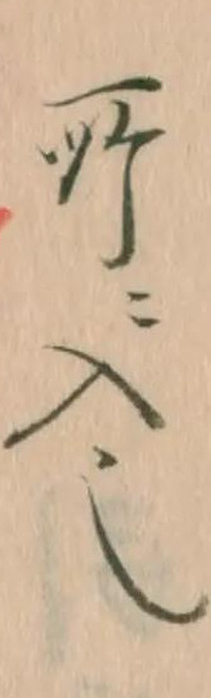所ニ入也
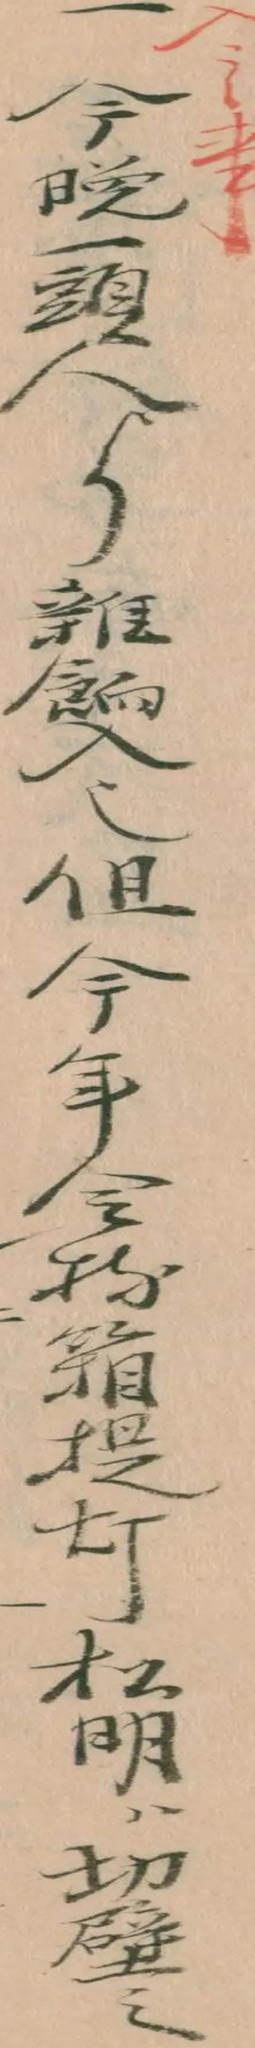○今晩一頭人より雑餉入也但今年令持箱提灯松明ハ切壁之
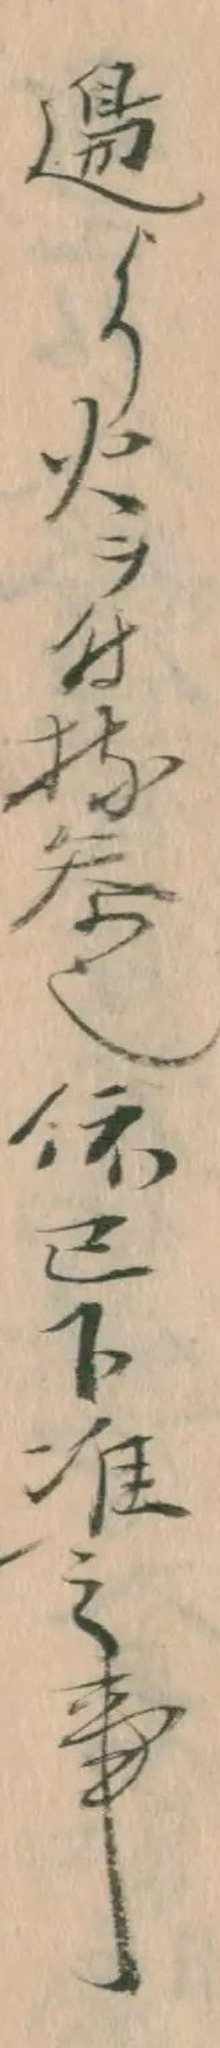邊より火ヲ付持参也依已下准之事
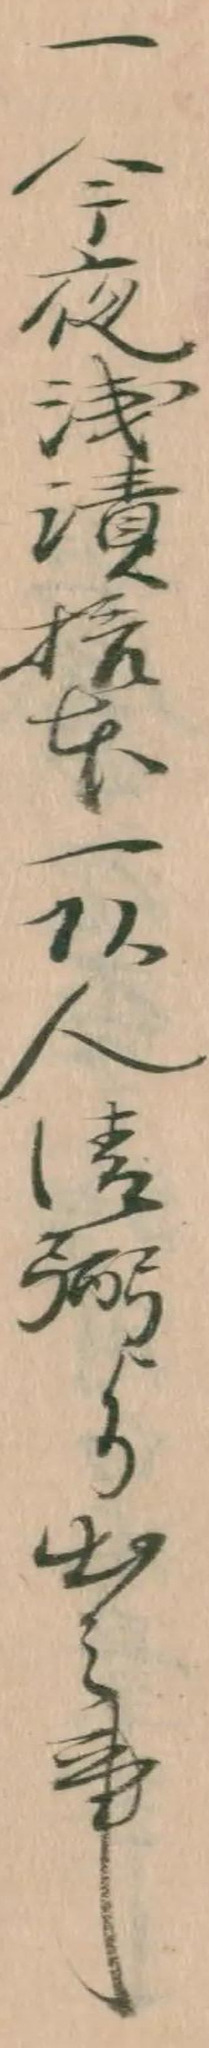一今夜浅漬拾本一頭人清弼より出之事
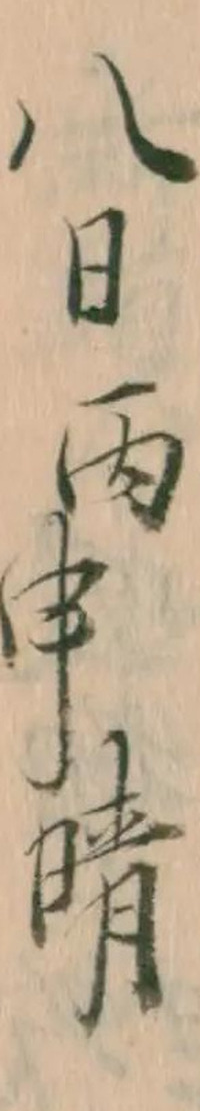八日丙申晴
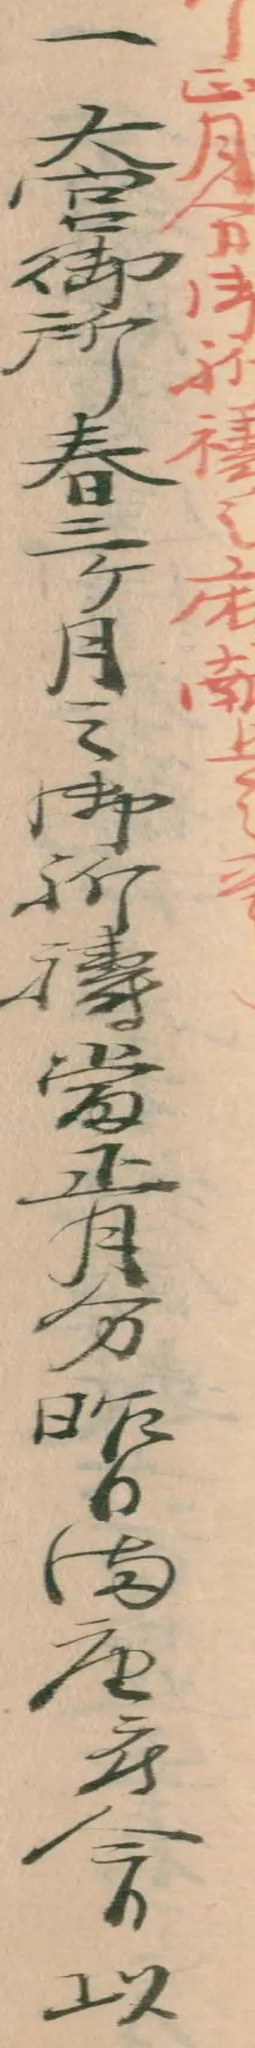一大宮御所春三ヶ月之御祈祷當正月分昨日満座ニ付今日以
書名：賀茂社記録. 第74冊
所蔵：国立国会図書館 National Diet Library, JAPAN
